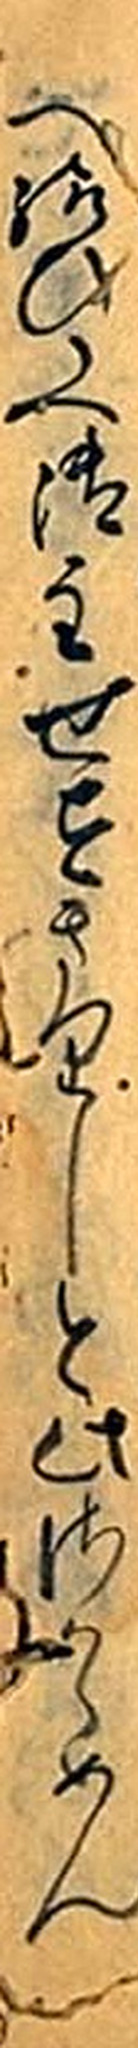へ給ひ又御主せすきりしと此さからめん

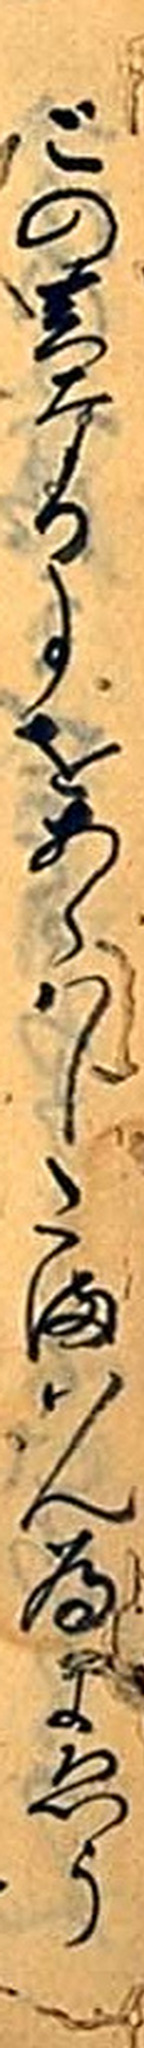との真なる事をあらはしたまはん為にゑう
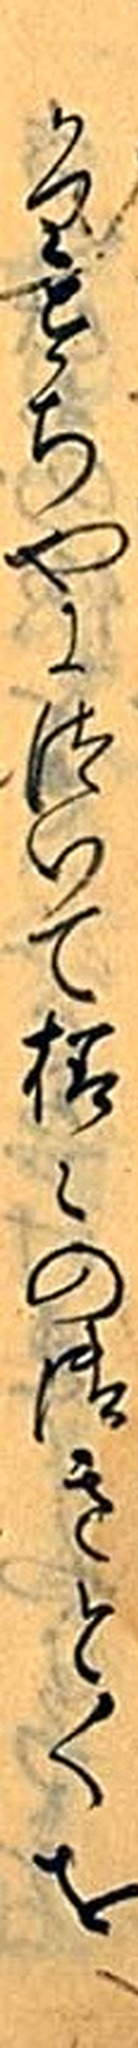かりすちやについて様々の御きとくを
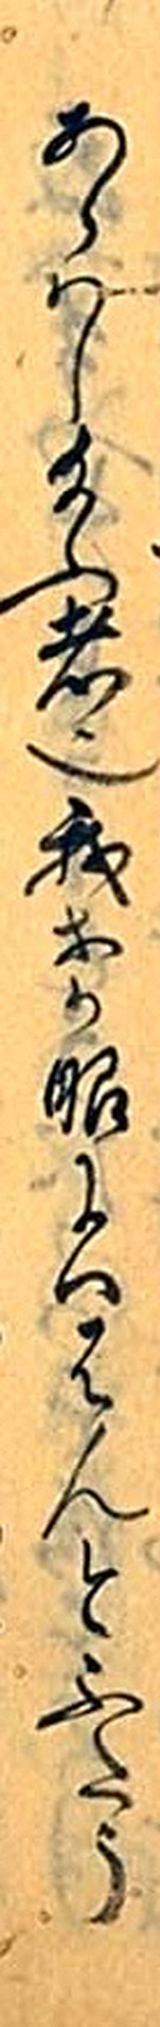あらはし給ふ者也我等か眼にははんとふたう
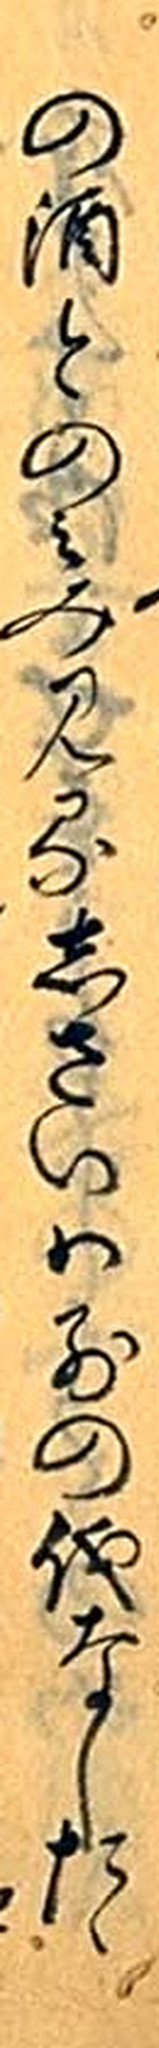の酒とのみみ見るしさいは別の儀なしたゝ
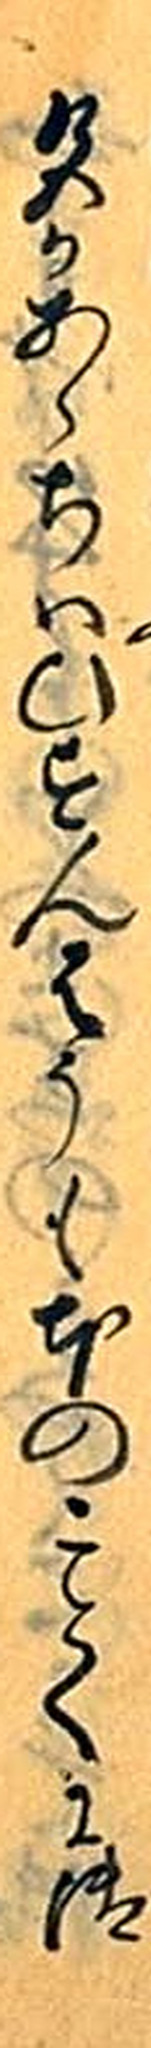色かあらちはひすんはうも本のことくに御
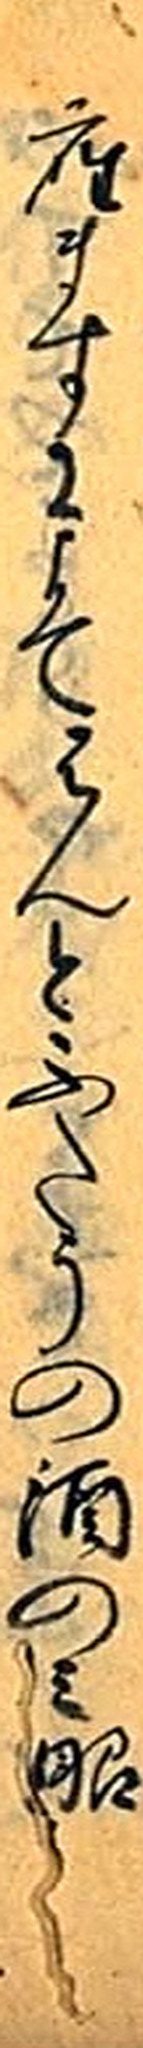座ますによてはんとふたうの酒のみ眼
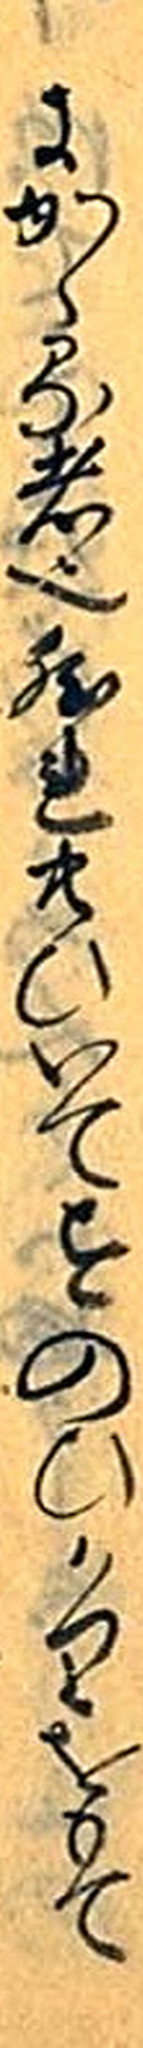にかゝる者也然れ共ひいてすのひかりをもて
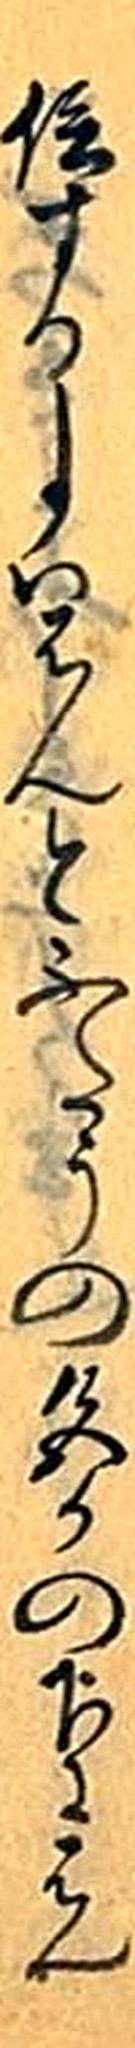信する事ははんとふたうの色かの下にはん
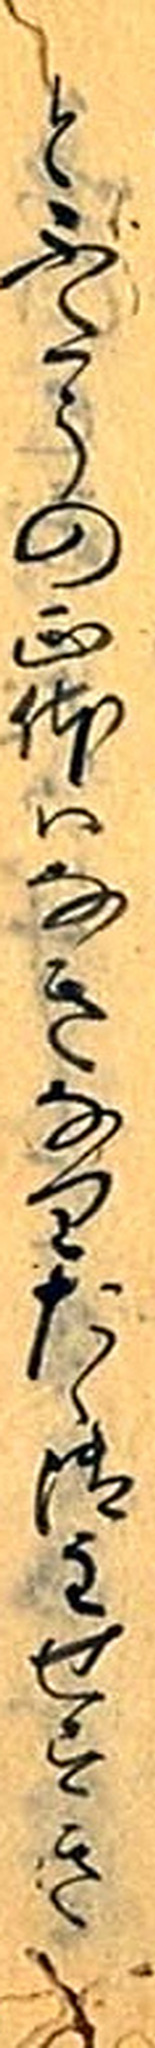とぶたうの正体はなきなりたゝ御主せすき
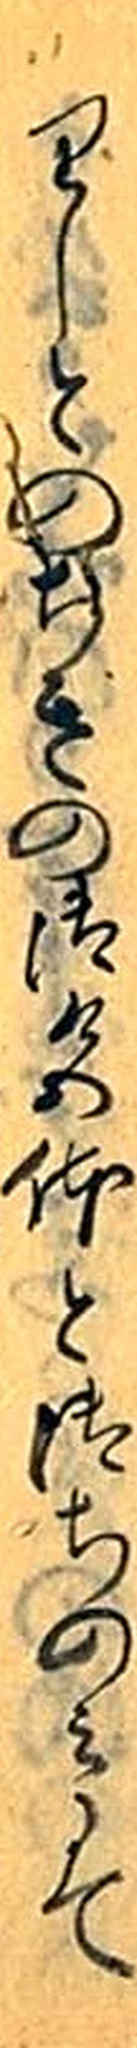りしとのちきの御色体と御ちのみにて
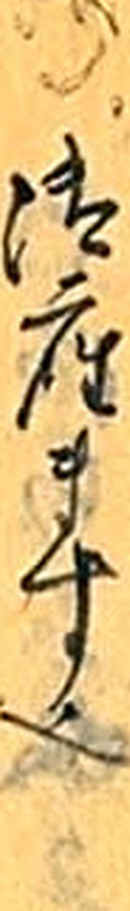御座ます也
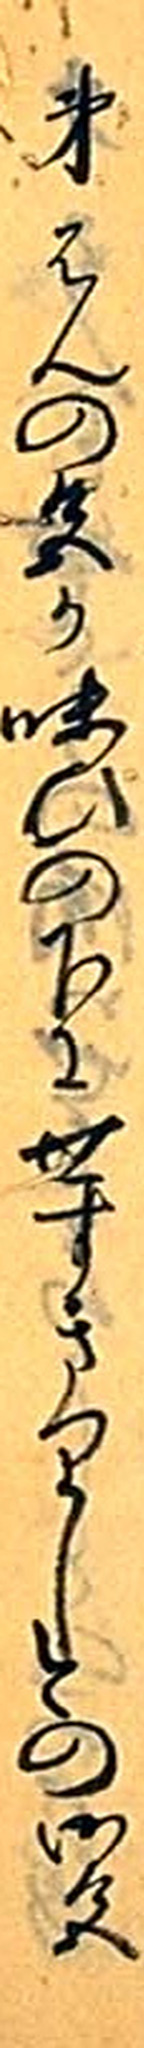弟はんの色か味ひの下にせすきりしとの御色
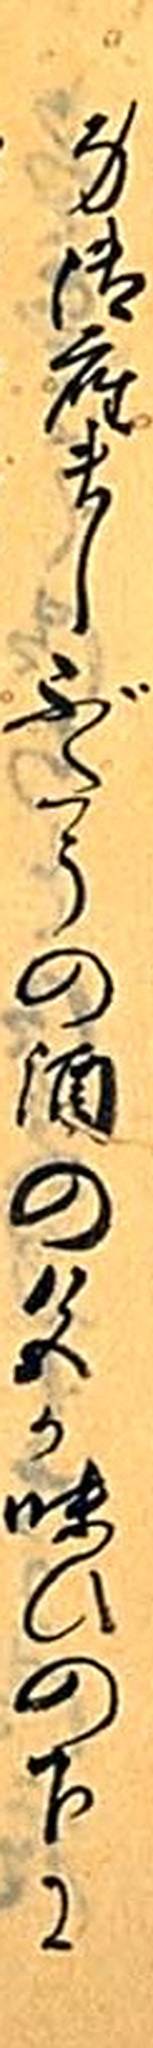身御座ましぶたうの酒の色か味ひの下に
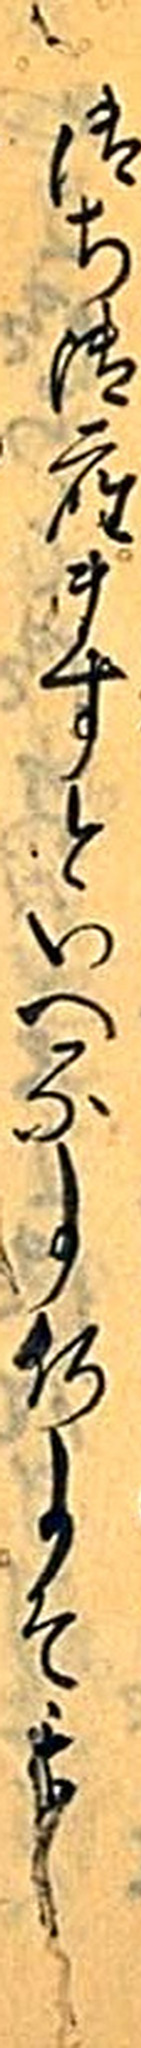御ち御座ますといへる事何事そ
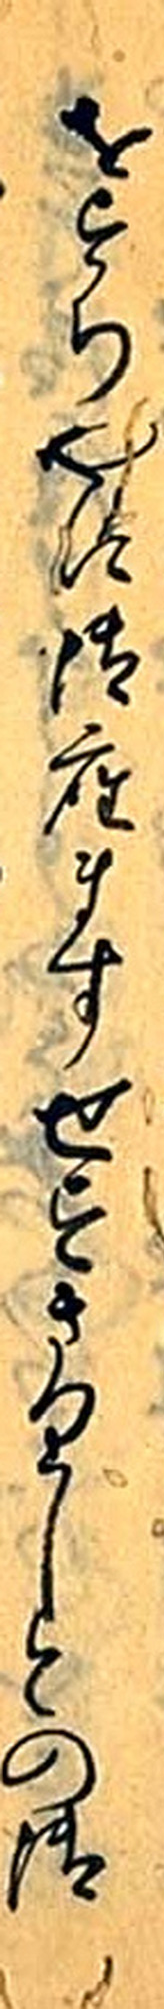をすちやに御座ますせすきりしとの御
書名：ドチリナ・キリシタン
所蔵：東京大学総合図書館 / General Library in the University of Tokyo
